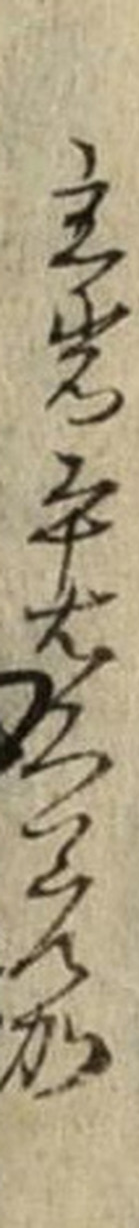立岩平右衛門殿
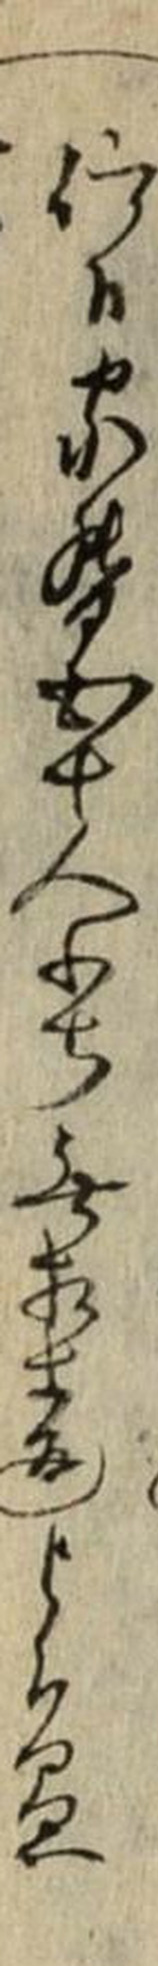仰付家督五十人ふち無相違被下置
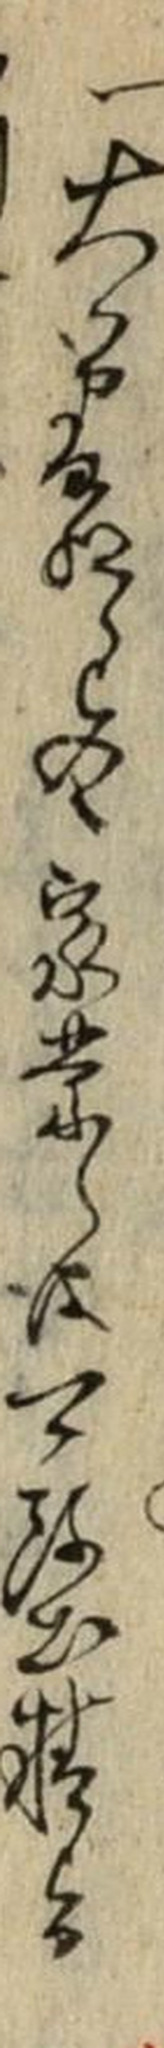大御番組へ被入候家業之儀可致出精旨
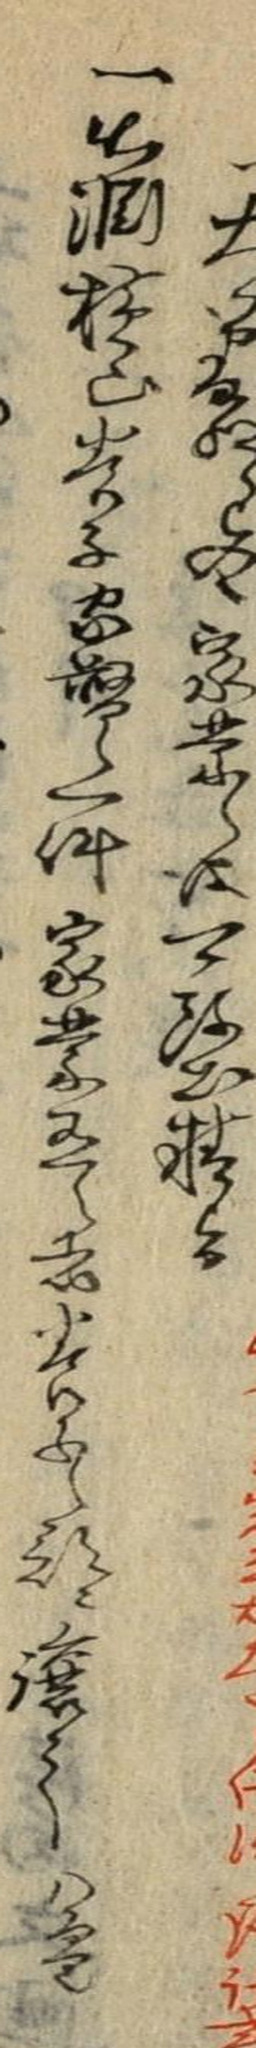一出淵横山養子家督一件家業有之者養子之部ニ譲之八百里
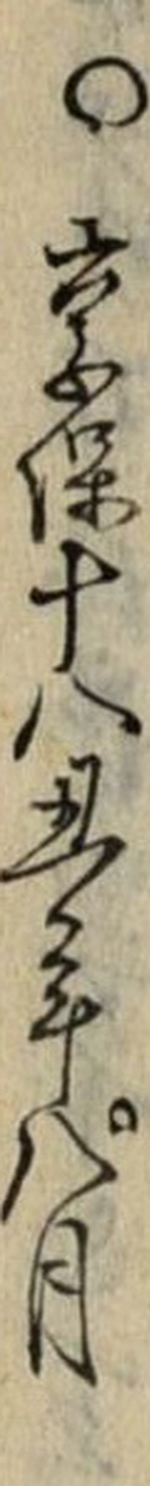〇享保十八丑年八月
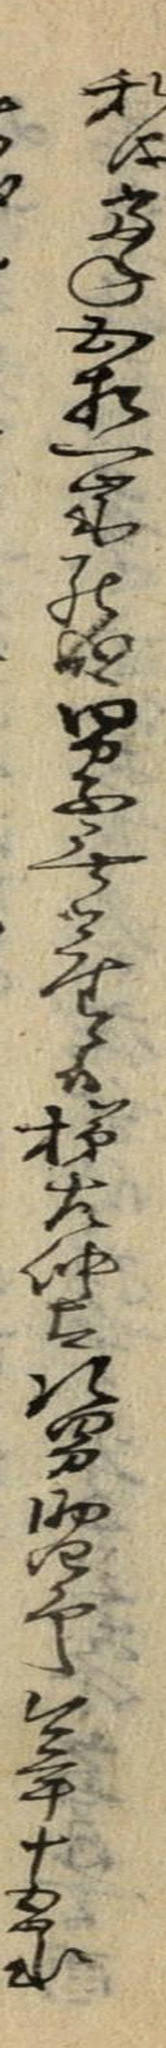私儀当年五拾一歳罷成候男子無御座候ニ付梯左仲太次男助四郎今年十五歳
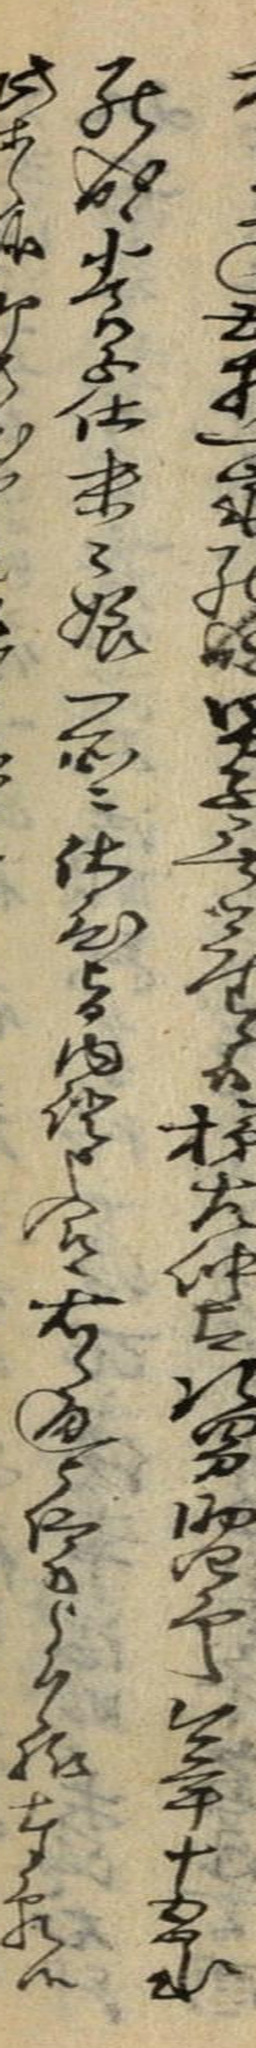罷成候養子仕末々娘一所ニ仕度旨内証申合候右之通被仰付被下候様奉願候
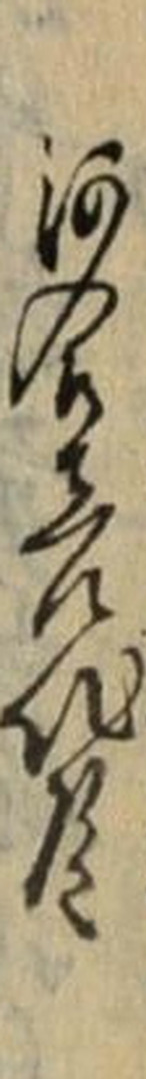河合彦作殿
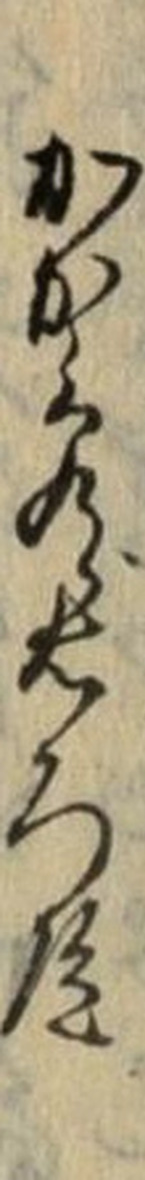加賀九郎右衛門殿
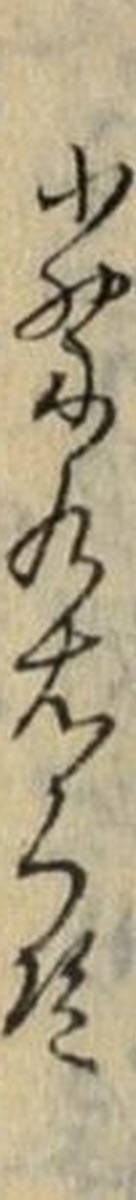小栗九右衛門殿
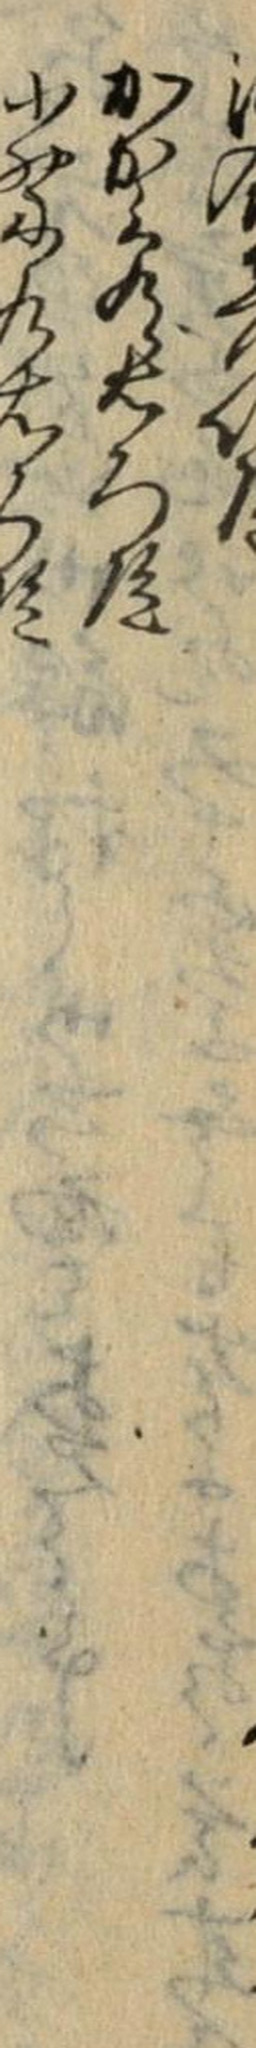小栗九右衛門殿
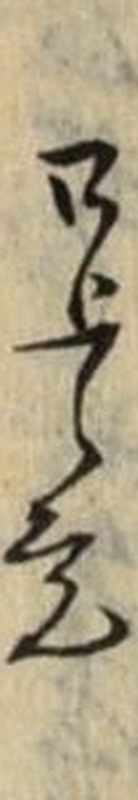口上之覚
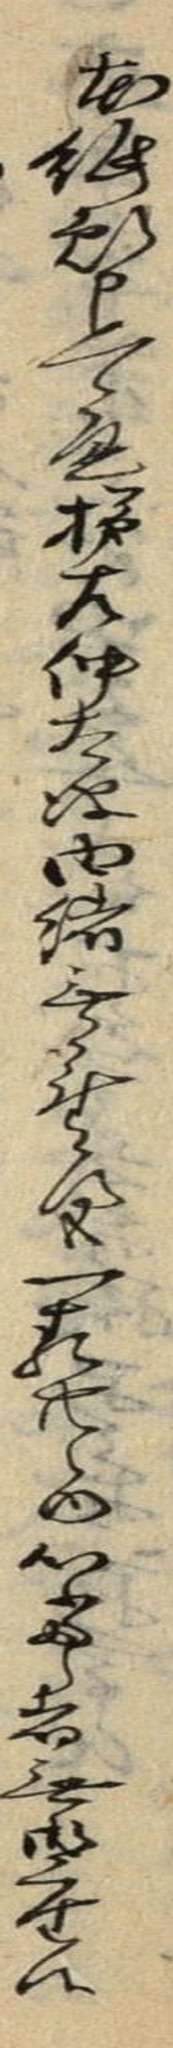本紙願申上候通梯左仲太儀由緒無御座候得共一類共之内心当之者無御座候
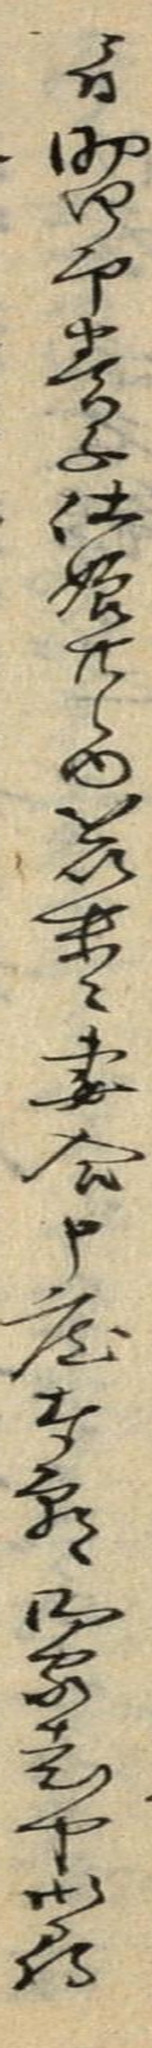ニ付助四郎養子仕娘共之内を以末々妻合申度奉願候御家老中御尋
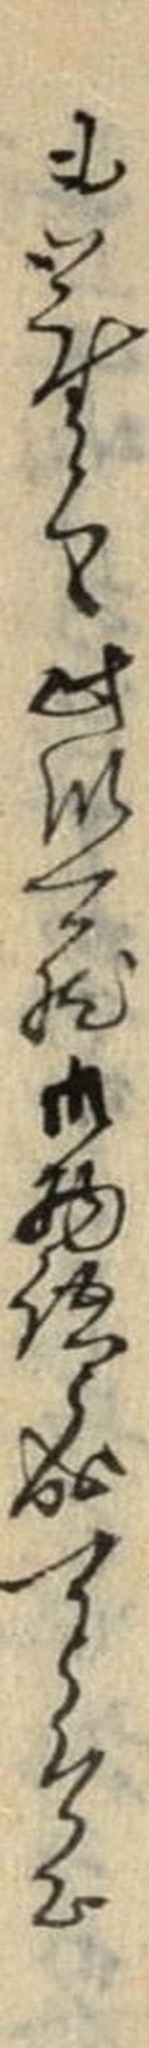も御座候へ者此段可然御物語被成可被下候以上
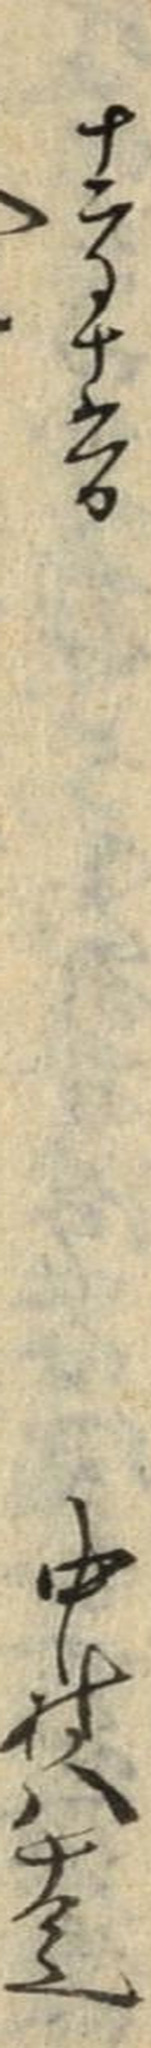十二月十六日中村八太夫
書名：養子縁組之部
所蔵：福井県文書館 Fukui Prefectural Archives
